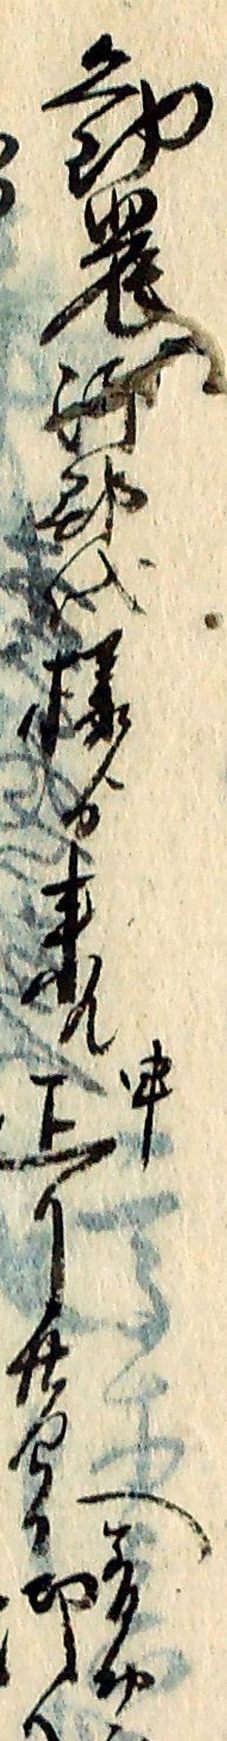勧農御郡代様ゟ来る申正月廿四日善助義
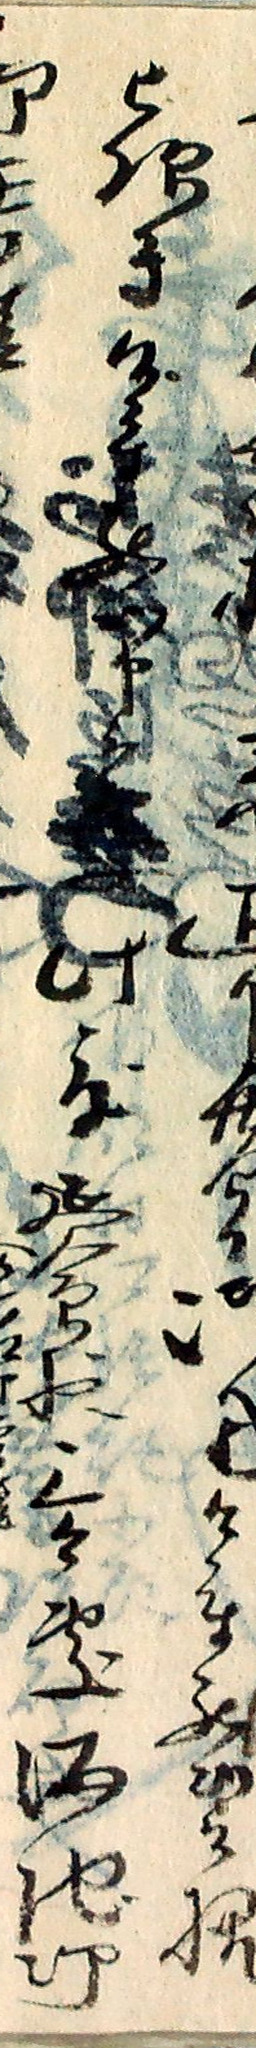被仰付候に付罷出申候此度延命村へ三ヶ処溜池御
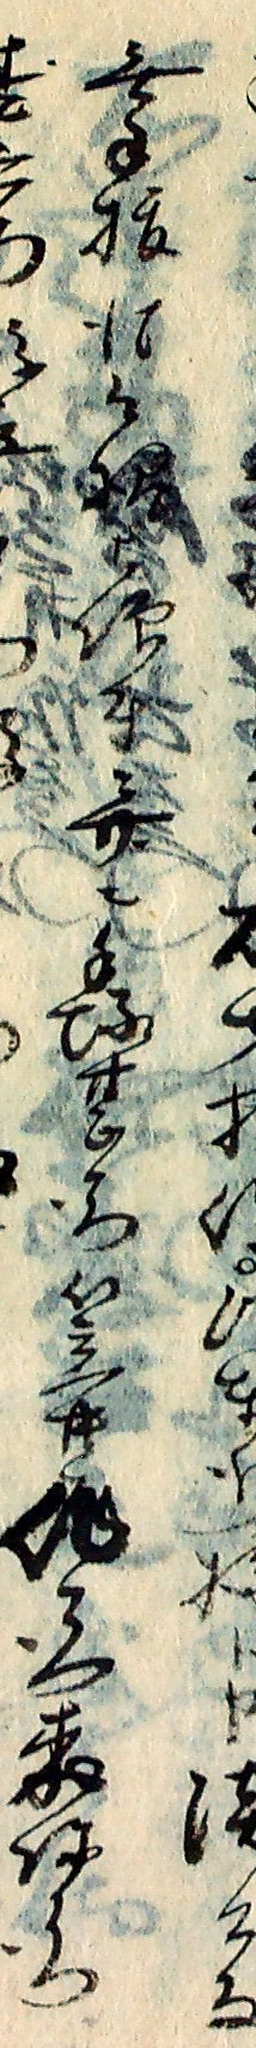無手抜仕候様被仰付并に手塚甚右衛門笠井作右衛門森弥右衛門
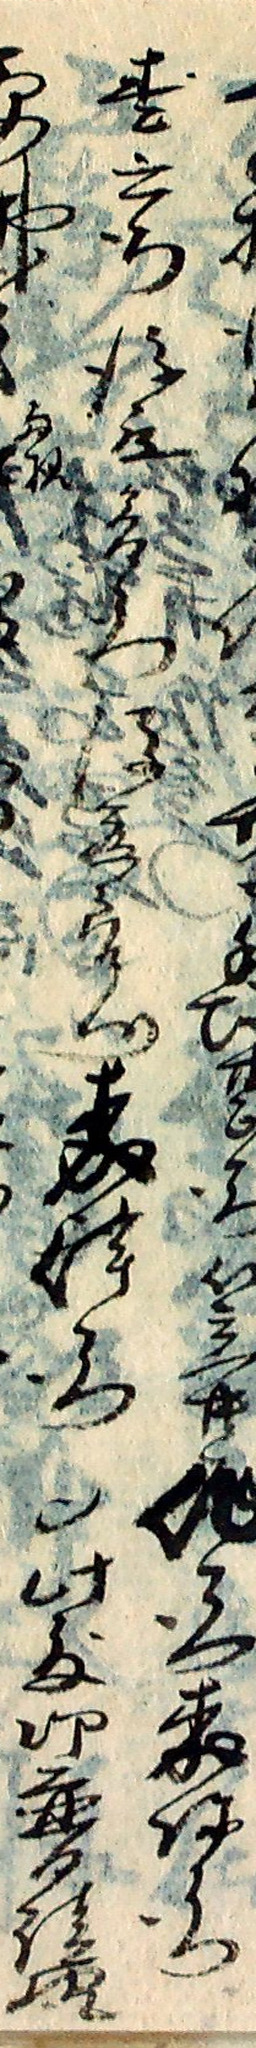盛六右衛門後藤善右衛門後藤秀次郎森倖右衛門〆此度御普請始
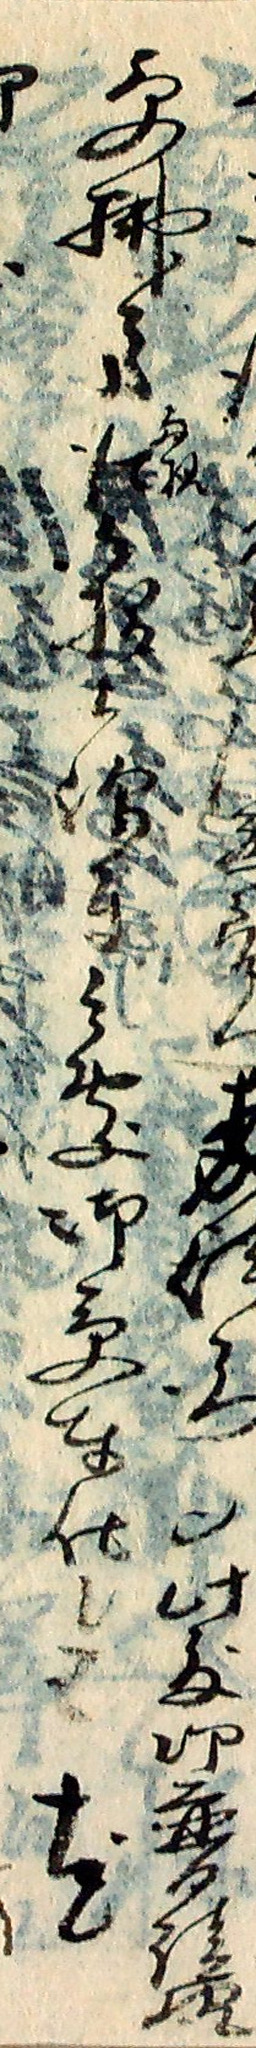受払方両様仕候様被仰付候処御受奉仕候尤
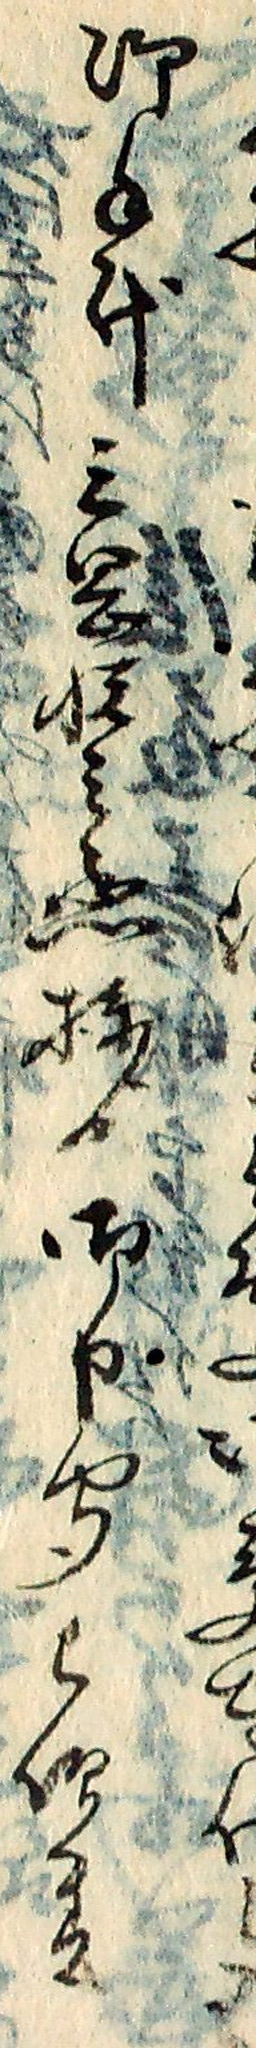御手代三岡悦之丞様ゟ御申聞被仰付候
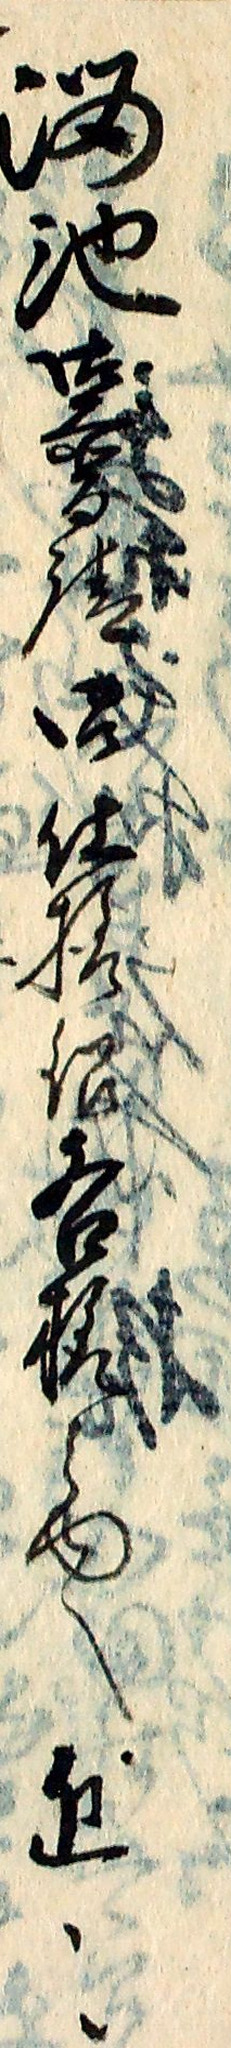溜池御普請御仕様銀各様之内へ近々
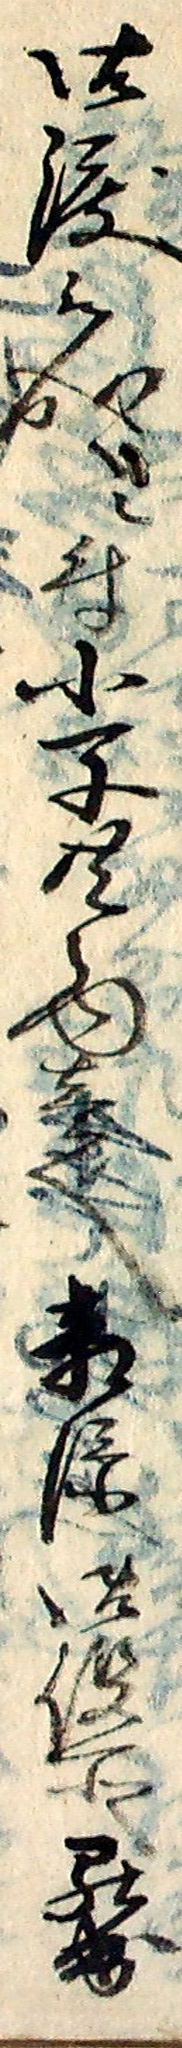御渡被成候に付小子共之内壱人相添御役所へ罷出
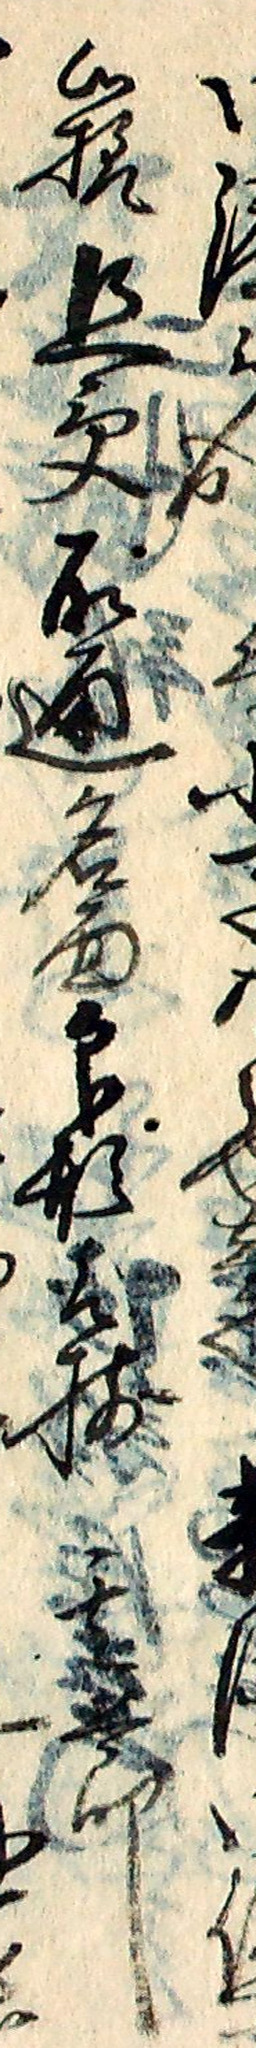候様且受取通名面印形取揃其節
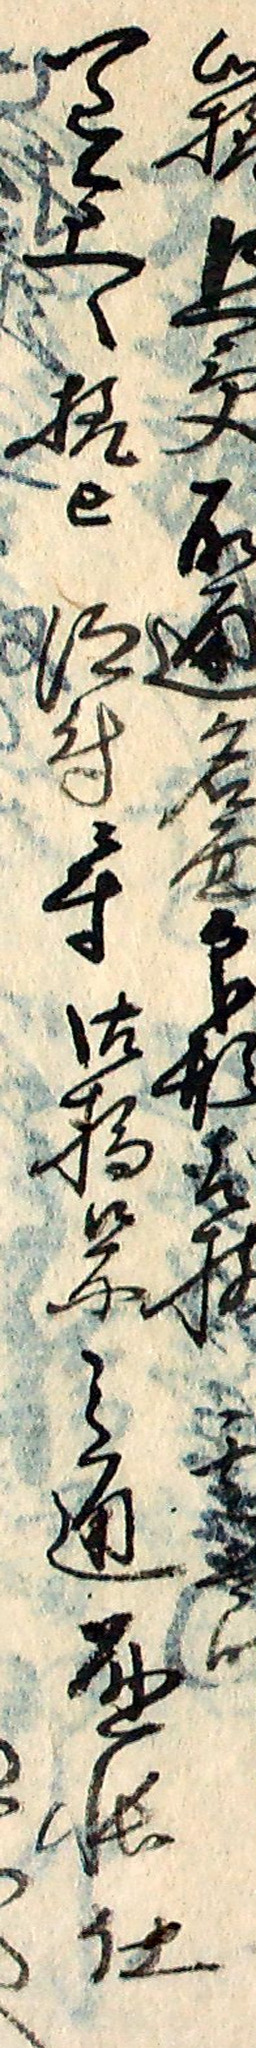差上候様被仰付に付御指図之通届帳仕
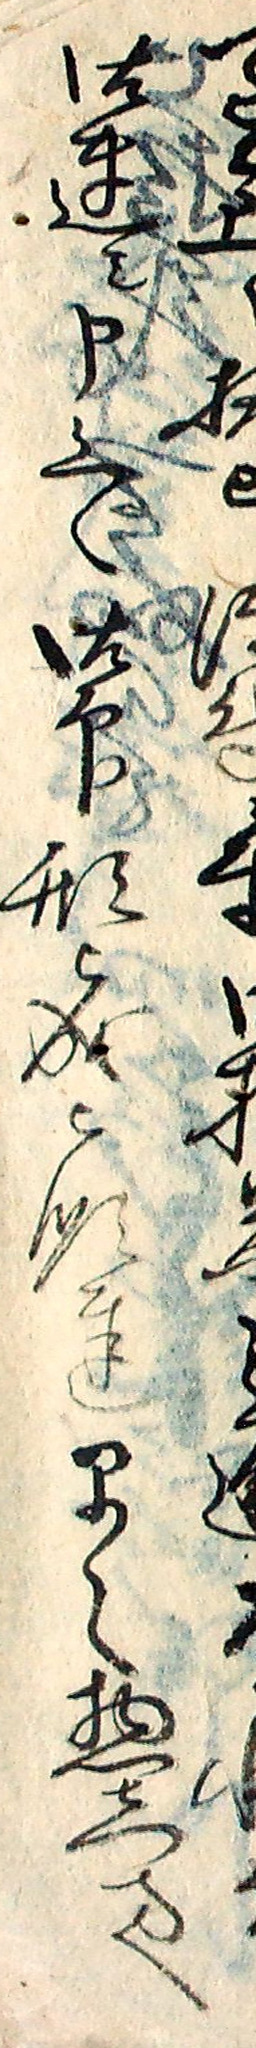御達し申上候御印形被成被順達早々惣右衛門方へ

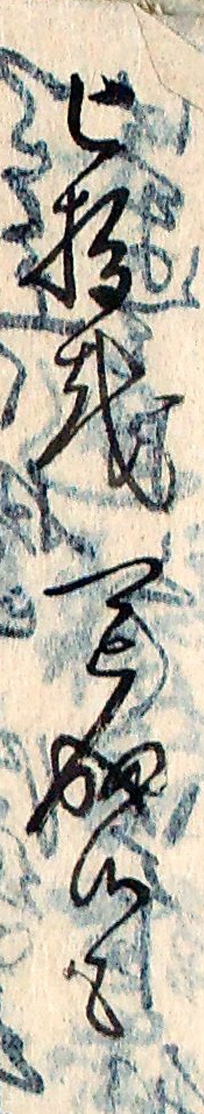被指越可被成候以上
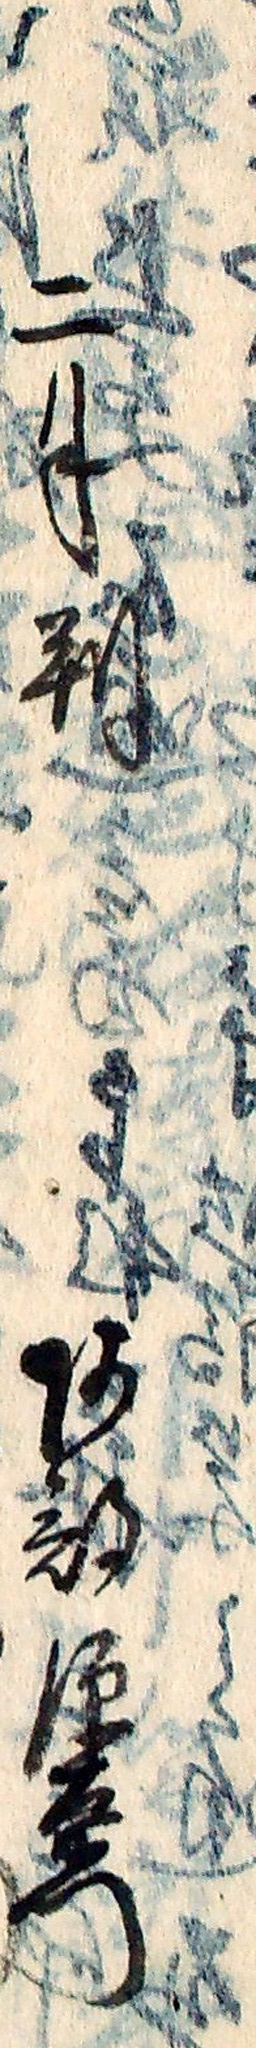二月朔阿部源右衛門
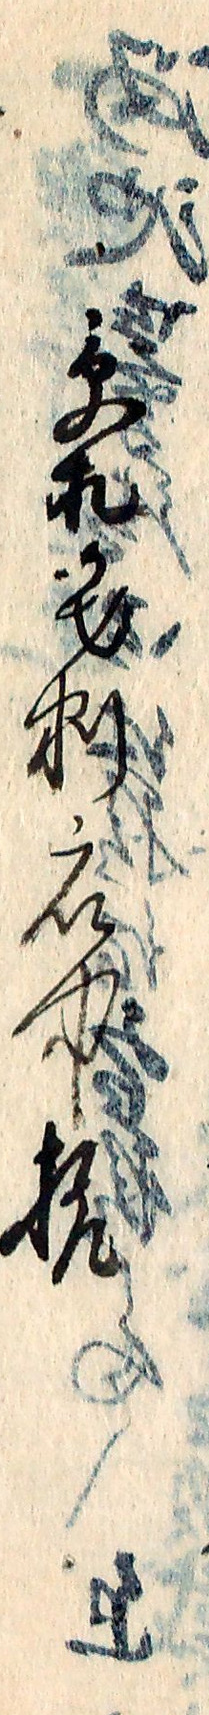受札御才判衆中様
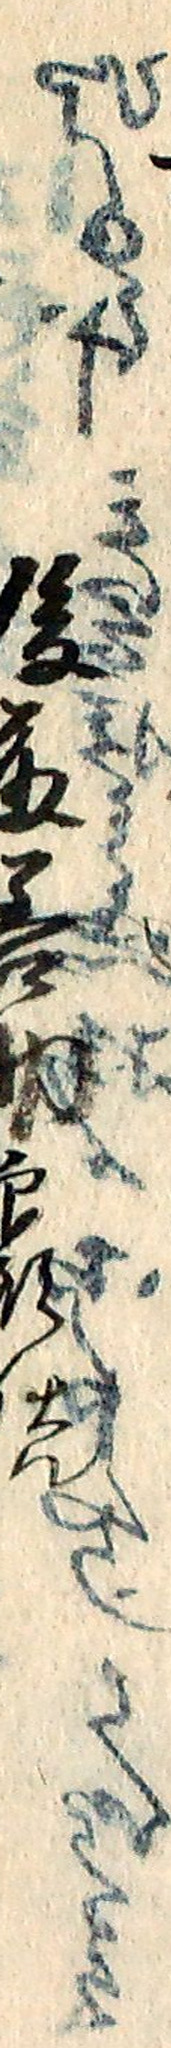後藤善助印形仕る
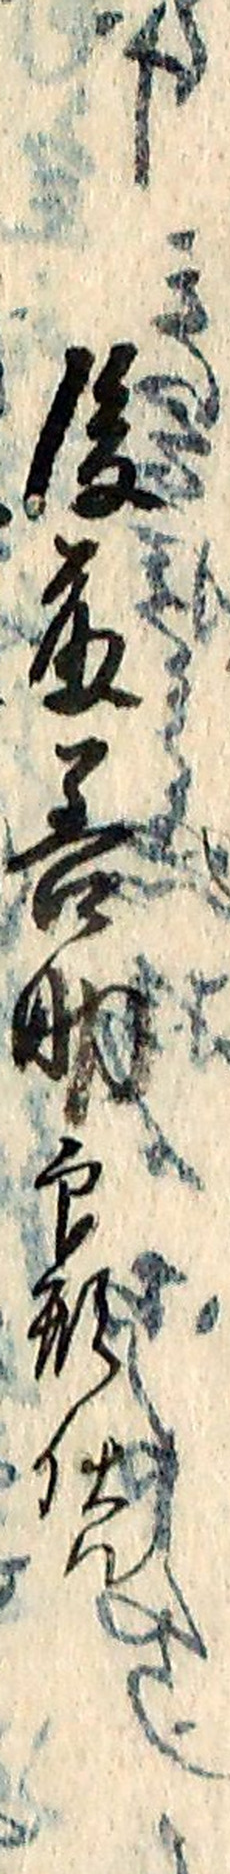後藤善助印形仕る
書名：諸御願書控(後藤氏壱番）
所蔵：鳴門教育大学 Naruto University of Education
